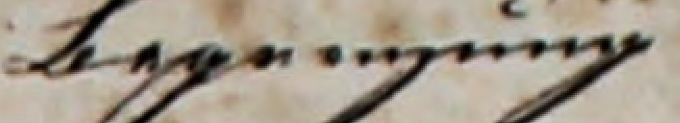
Begrenzung
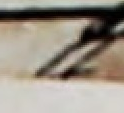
J.
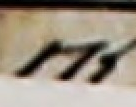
CK.
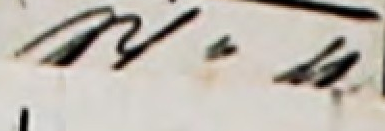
???
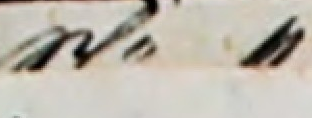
???
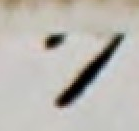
7
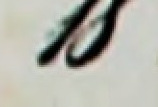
18
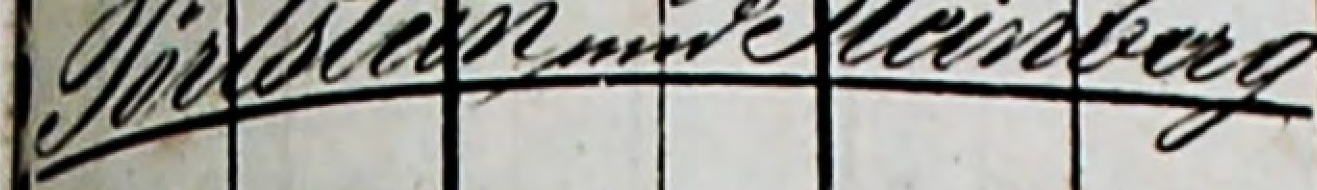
Törlstein und Steinberg
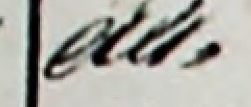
Alt=
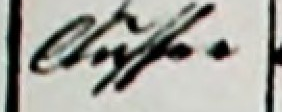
Aussee
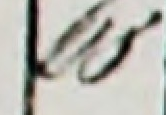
68
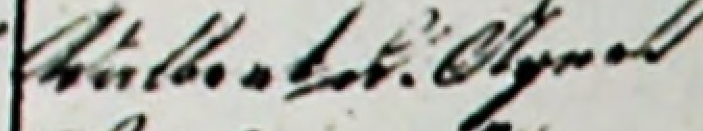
Adalbert ob. Agnes
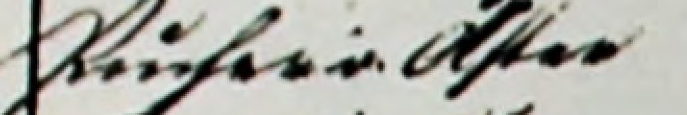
Pucherr Aster
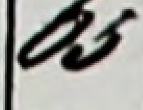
65
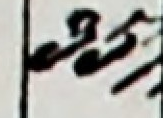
35
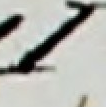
I
